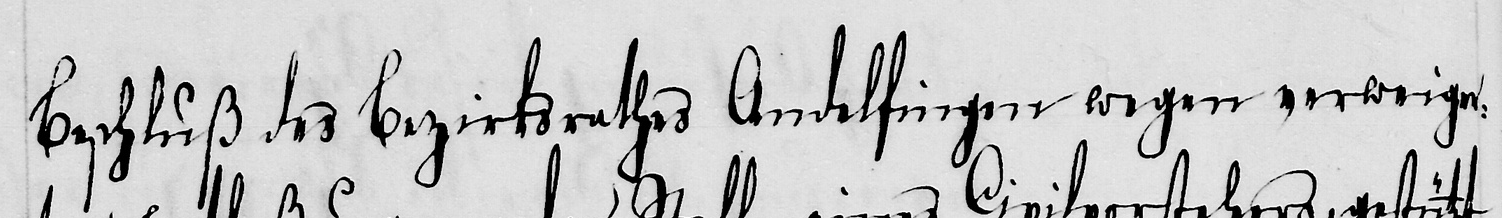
Beschluß des Bezirksrathes Andelfingen wegen verweiger¬
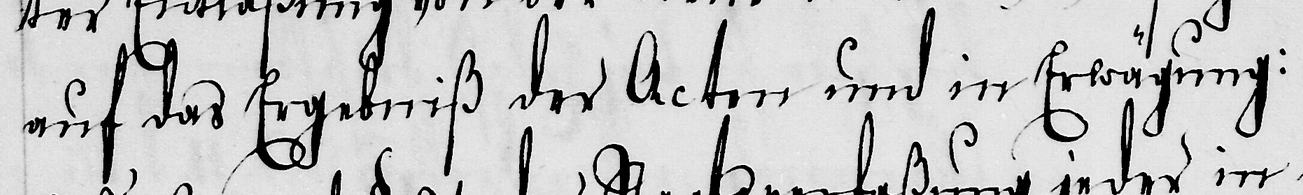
auf das Ergebniß der Acten und in Erwägung:
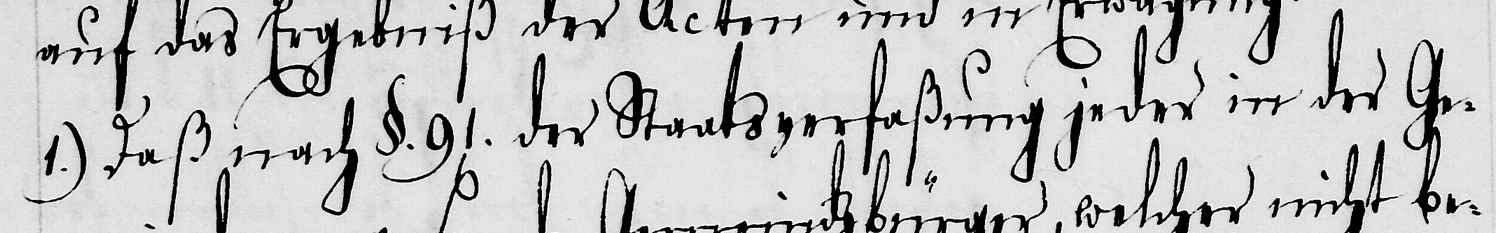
1.) Daß nach §. 91. der Staatsverfaßung jeder in der Ge¬
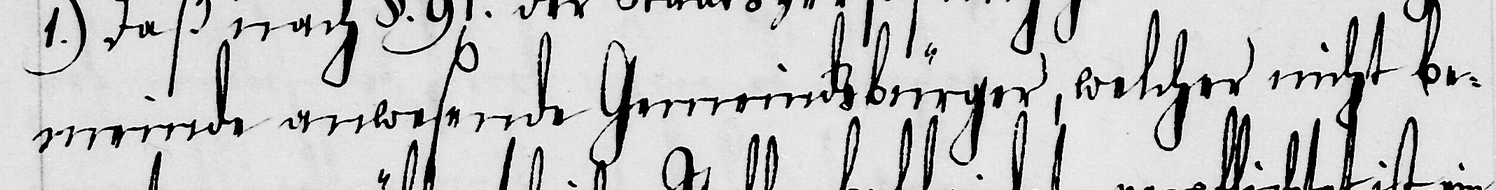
meinde anwesende Gemeindsbürger, welcher nicht be¬
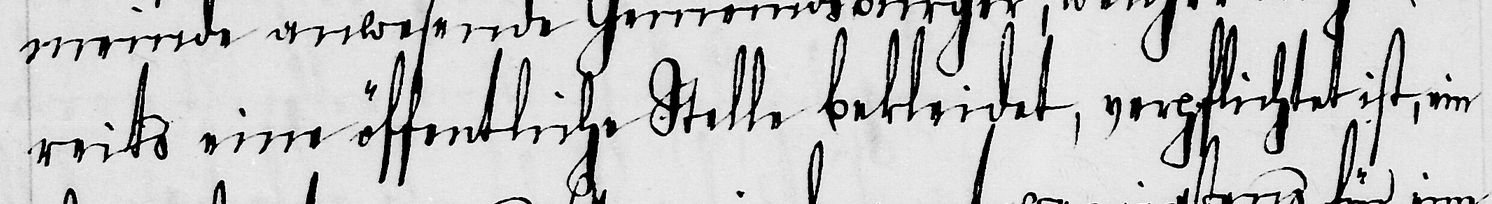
reits eine öffentliche Stelle bekleidet,
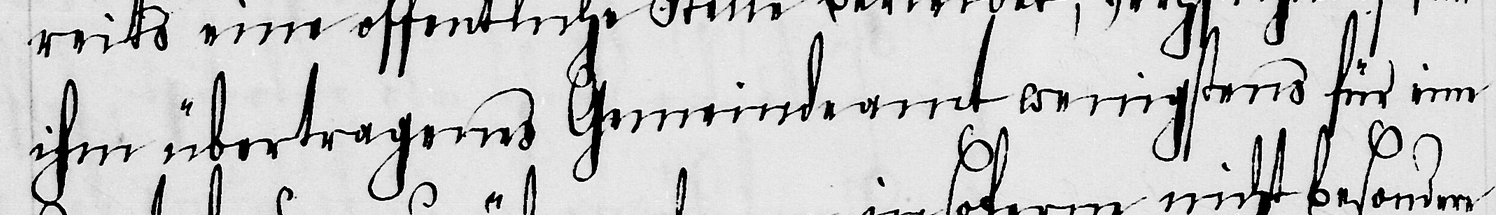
ihm übertragenes Gemeindeamt wenigstens für eine
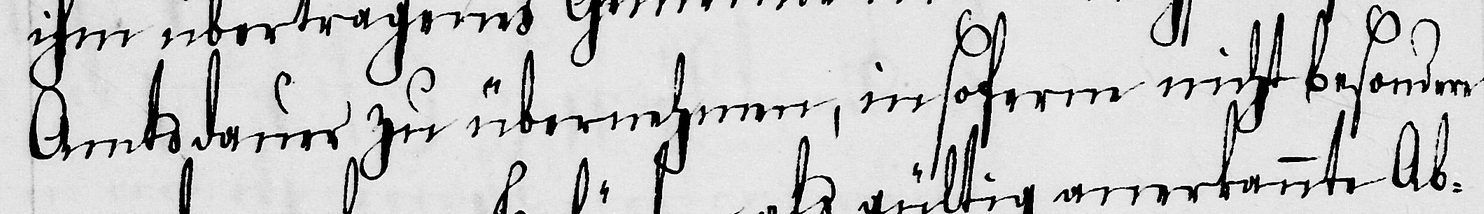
Amtsdauer zu übernehmen, in soferne nicht besondere
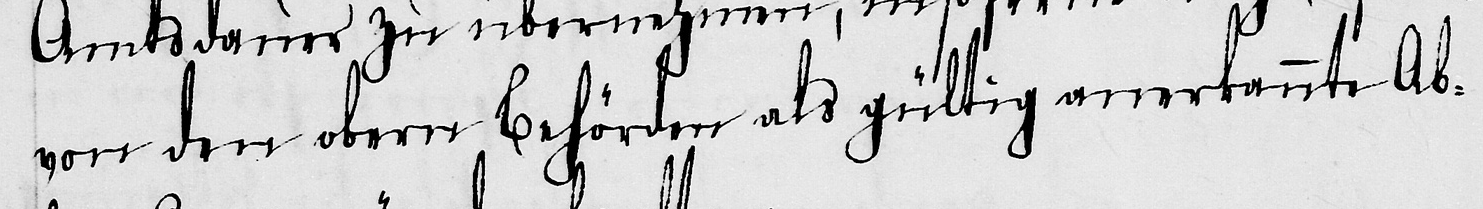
von den obern Behörden als gültig anerkannte Ab¬
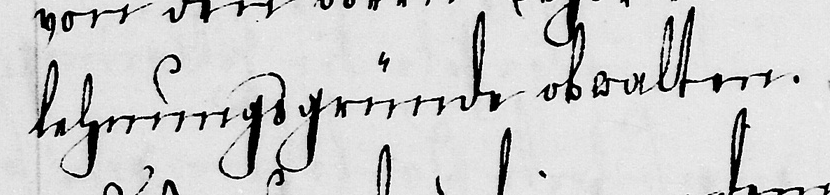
lehnungsgründe obwalten.
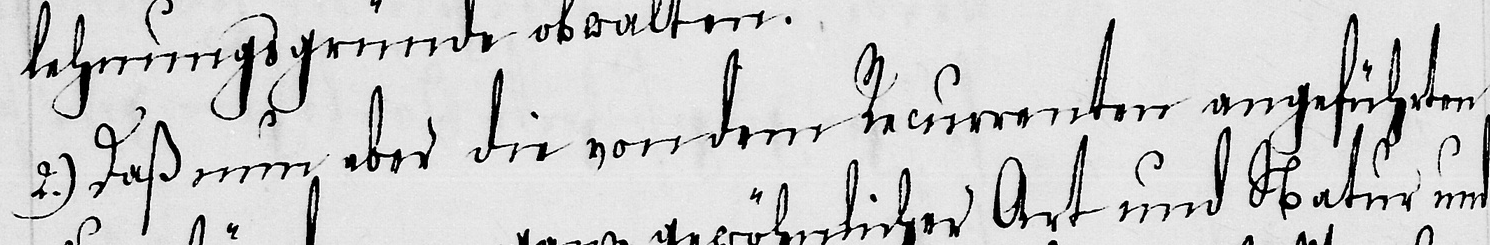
2.) Daß nun aber die von dem Recurrenten angeführten
